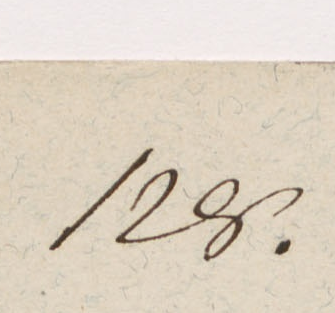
128.
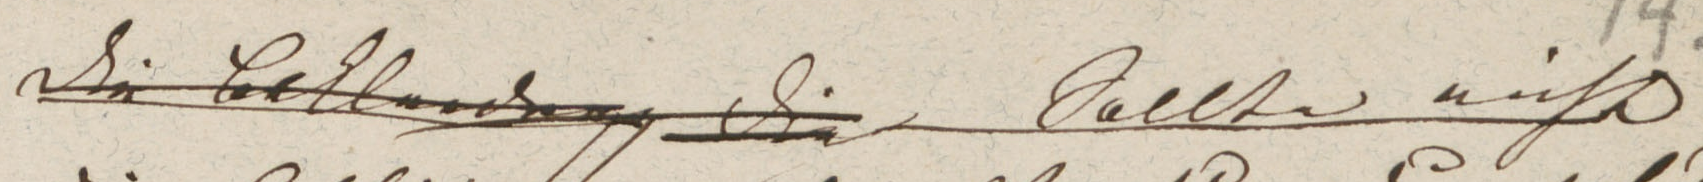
Die Bekleidung die Sollte nicht
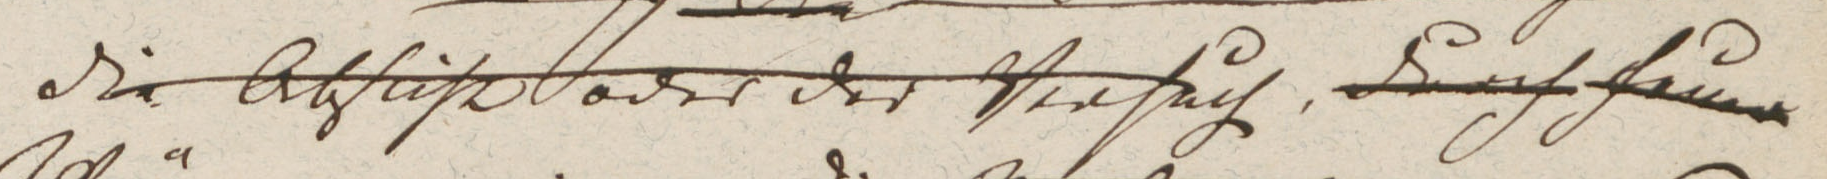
die Absicht oder der Versuch, durch Feuer
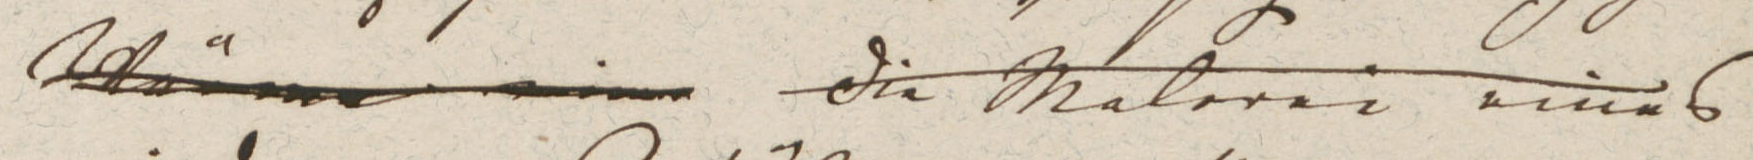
Wärme die Malerei eines
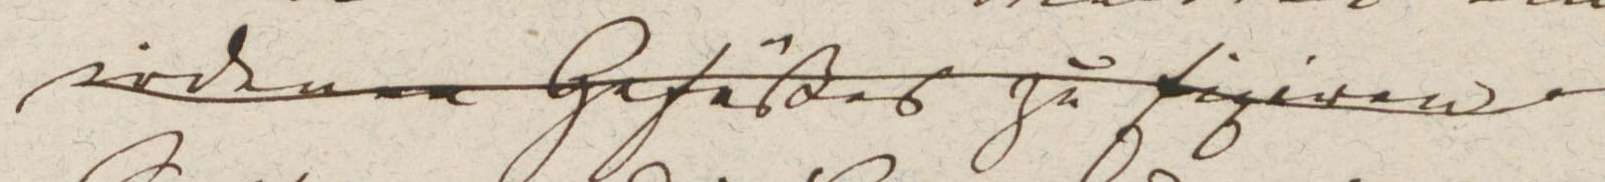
irdenen Gefässes zu fixiren
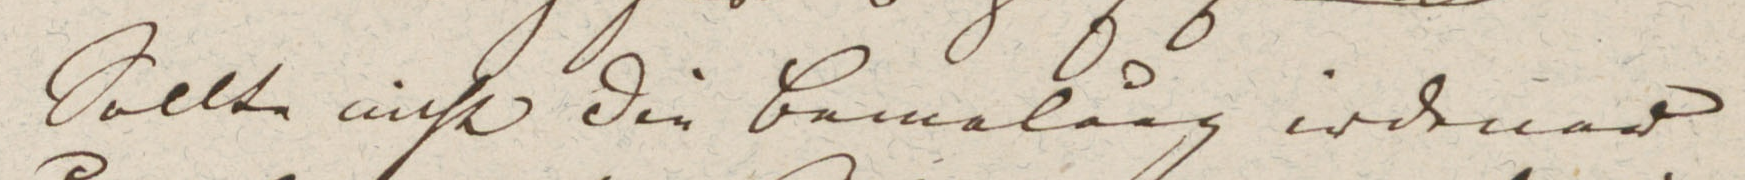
Sollte nicht die Bemalung irdener
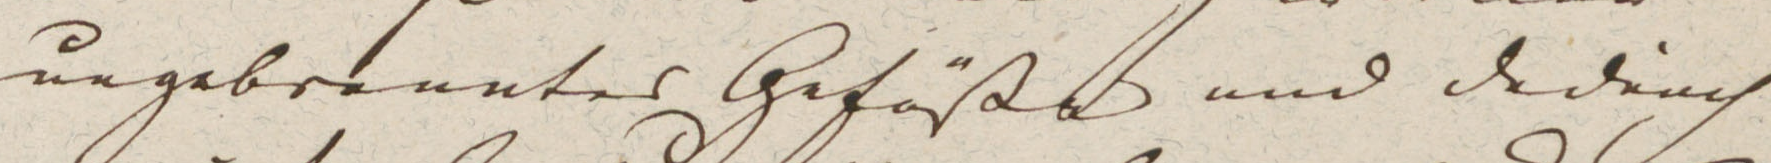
ungebrannter Gefässe und dadurch
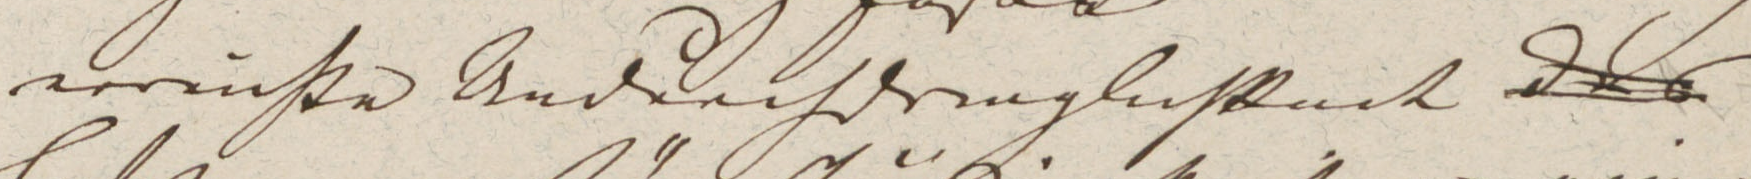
erreichte Undurchdringlichkeit des
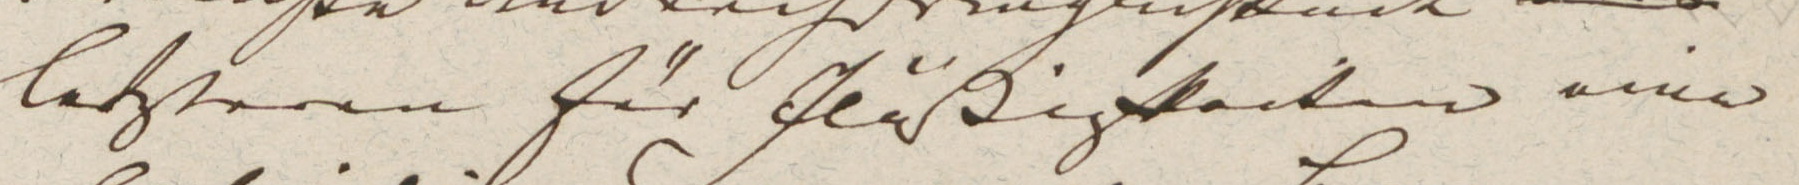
letzteren für Flüssigkeiten eine
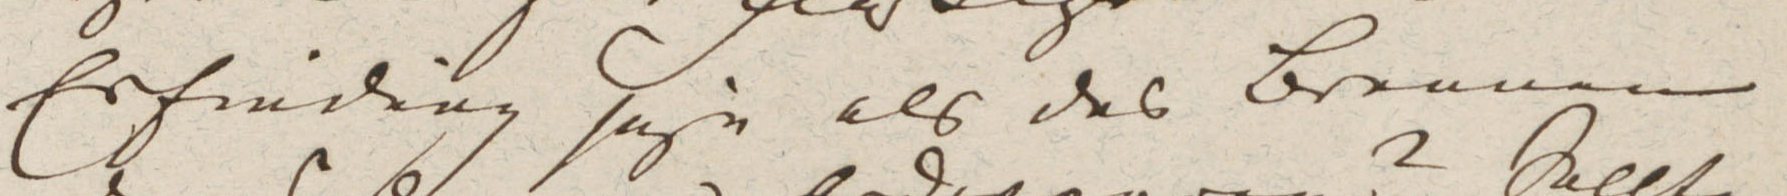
Erfindung seyn als das Brennen
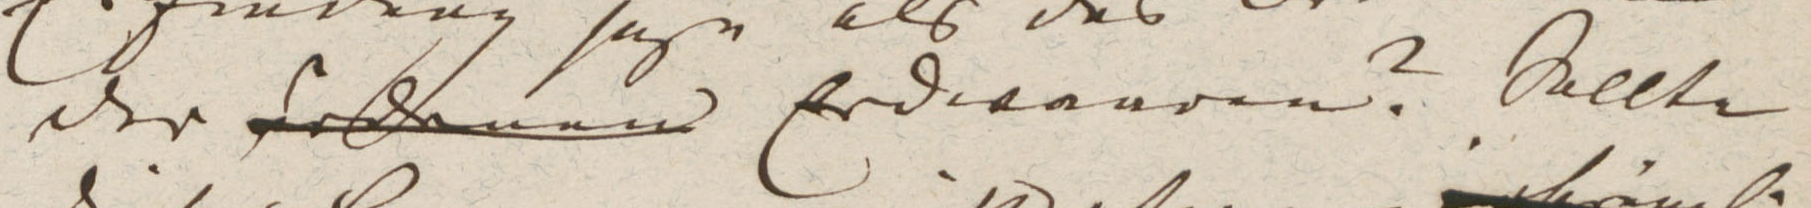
der irdenen Erdwaaren? Sollte
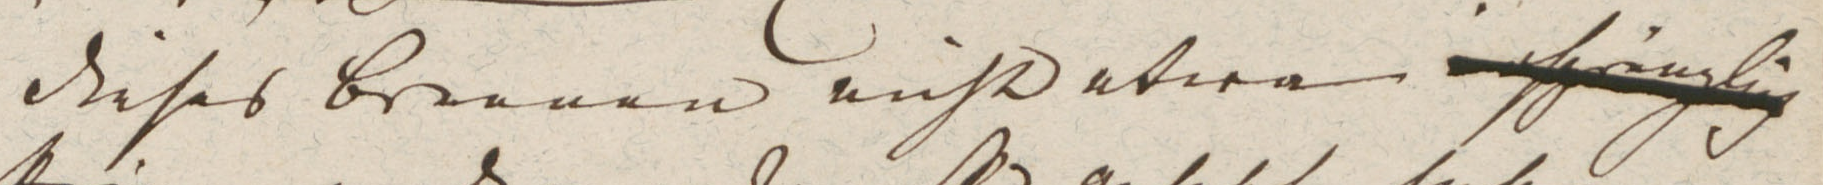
dieses Brennen nicht etwa ursprünglich
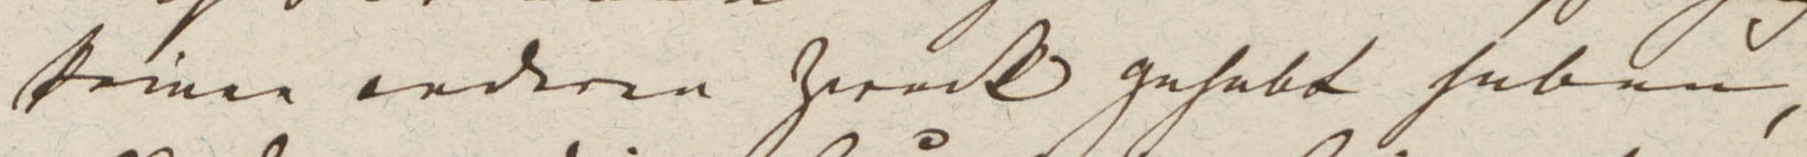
keinen anderen Zweck gehabt haben,
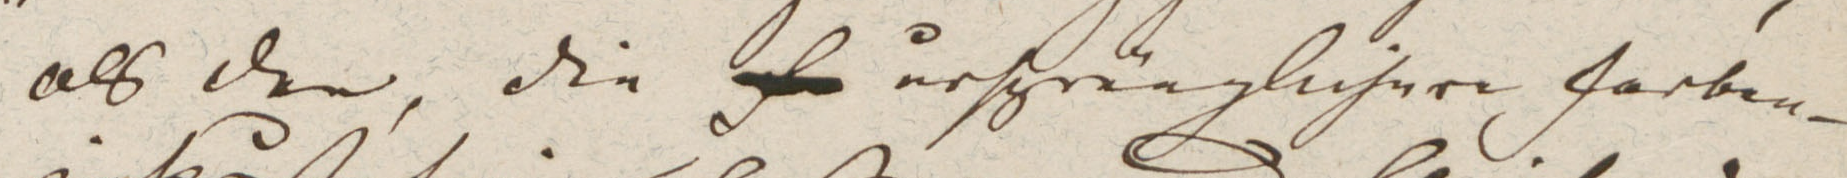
als den, die F ursprünglichere Farben-
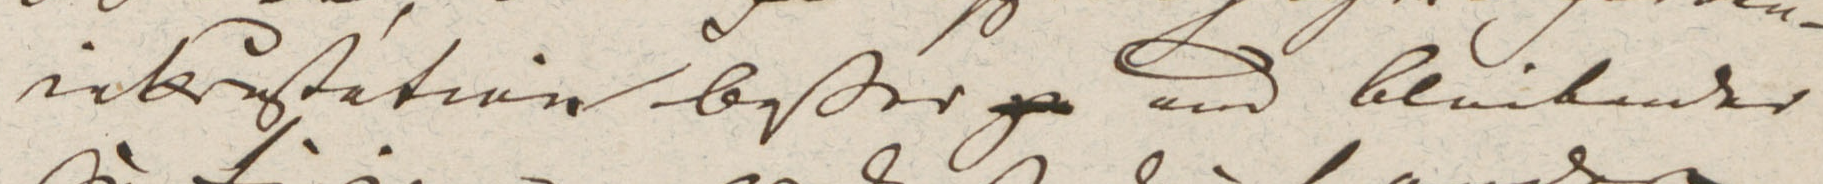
inkrustation besser und bleibender
